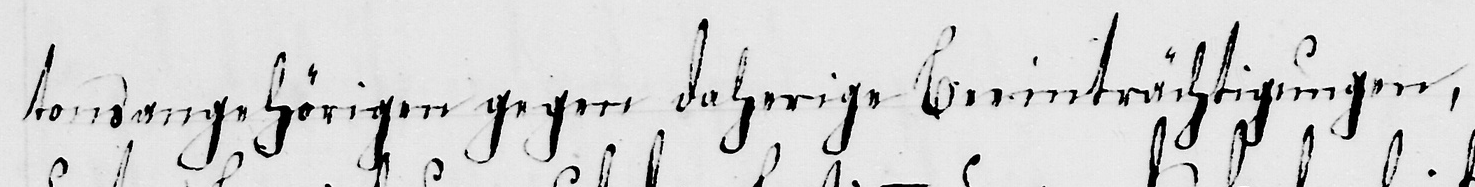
tonsangehörigen gegen daherige Beeinträchtigungen,
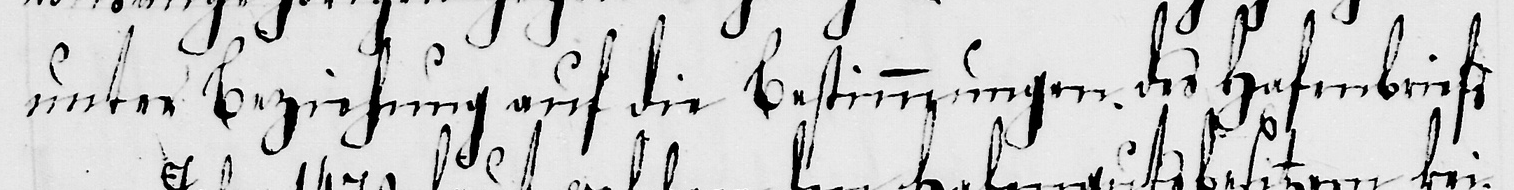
unter Beziehung auf die Bestimmungen des Hafenbriefs
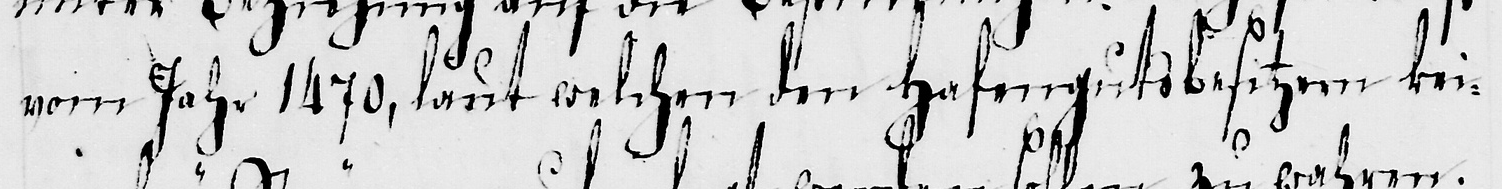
vom Jahr 1470, laut welchen den Hafengutsbesitzern kei¬
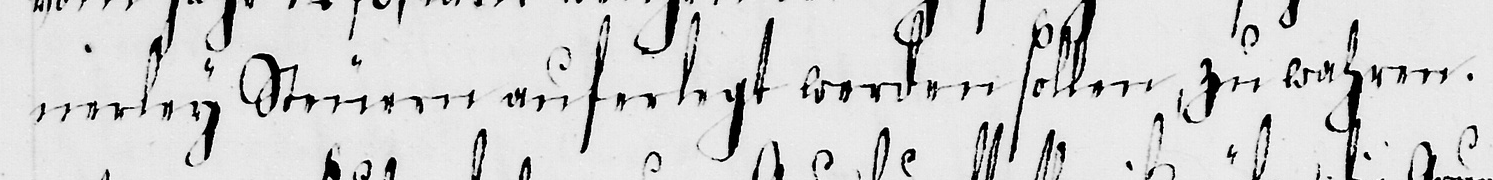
nerley Steuern auferlegt werden sollen, zu wahren.
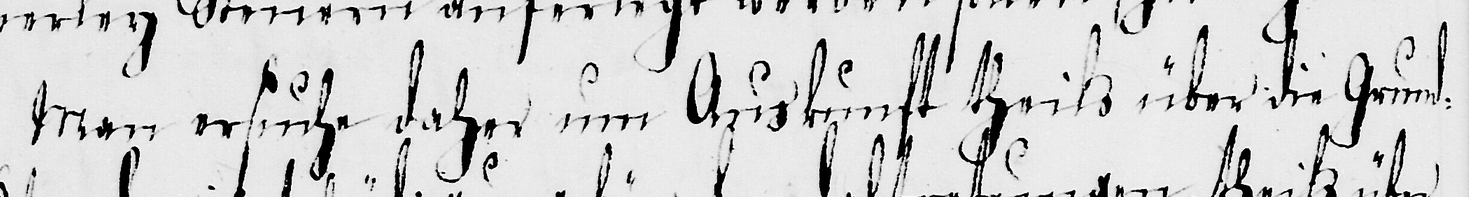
Man ersuche daher um Auskunft theils über die Grun¬
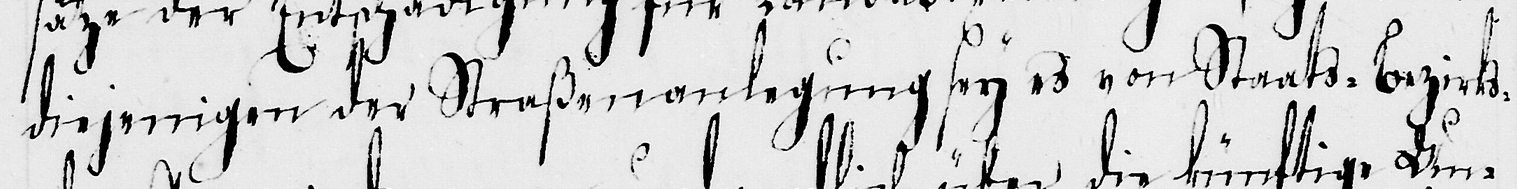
diejenigen der Straßenanlegung[,] sey es von Staats-[,] Bezirks-
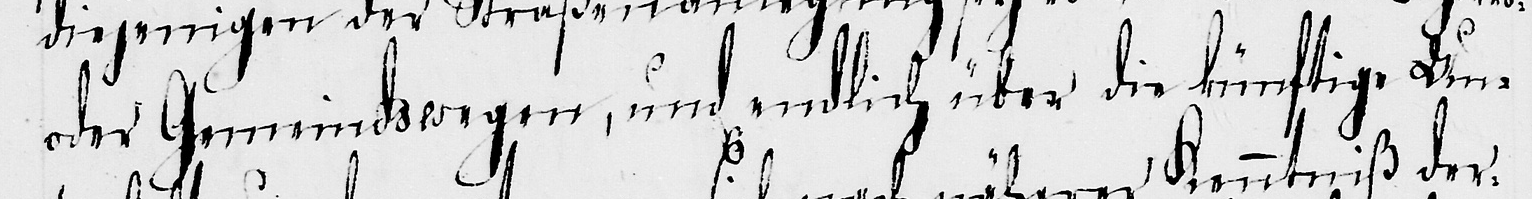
oder Gemeindswegen, und endlich über die künftige Un¬
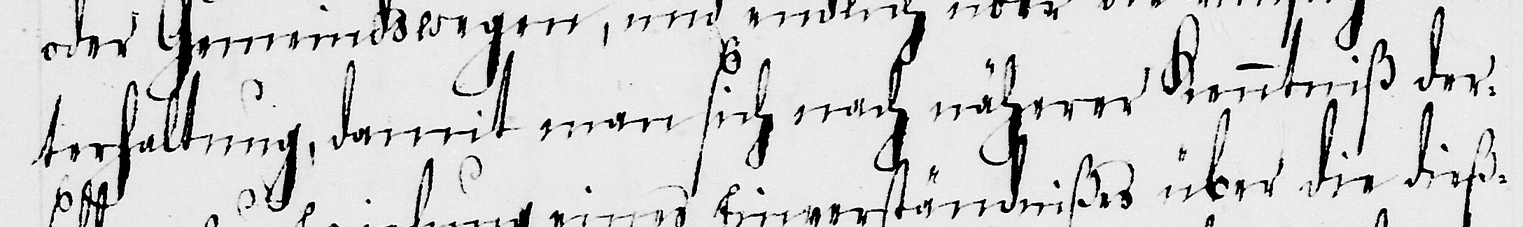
terhaltung, damit man sich nach näherer Kenntniß der¬
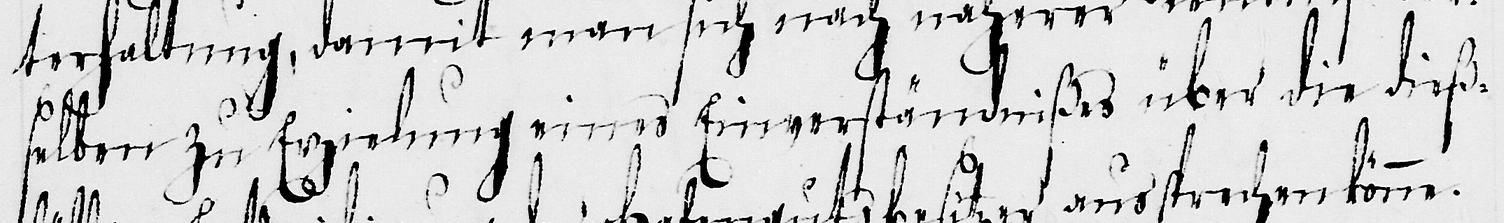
selben zu Erzielung eines Einverständnißes über die dieß¬
